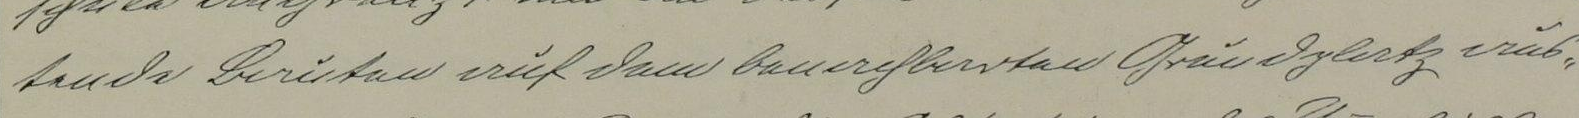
tende Bauten auf dem benachbarten Grundplatz aus-
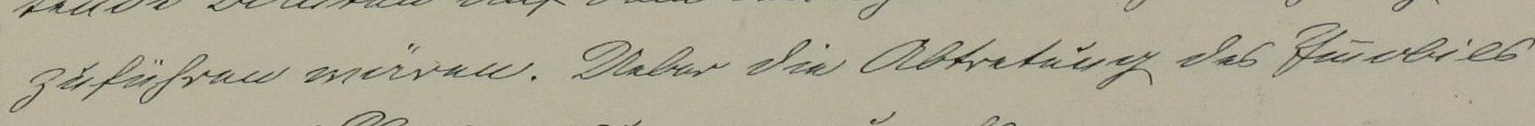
zuführen wären. Ueber die Abtretung des Immobils
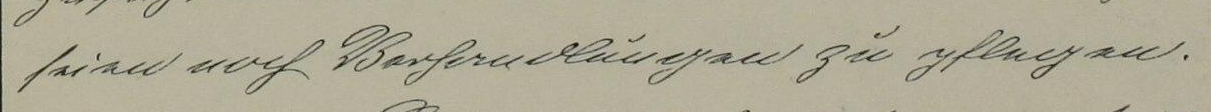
seien noch Verhandlungen zu pflegen.
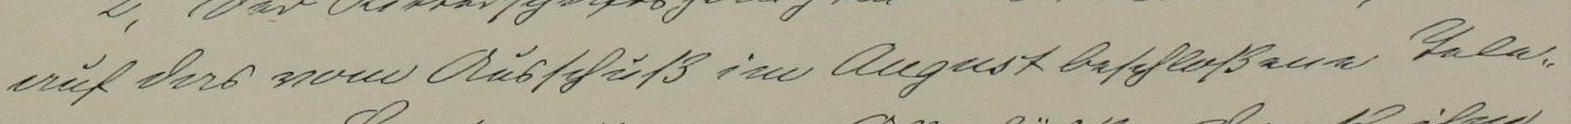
auf das vom Ausschuß im August beschloßene Tele-
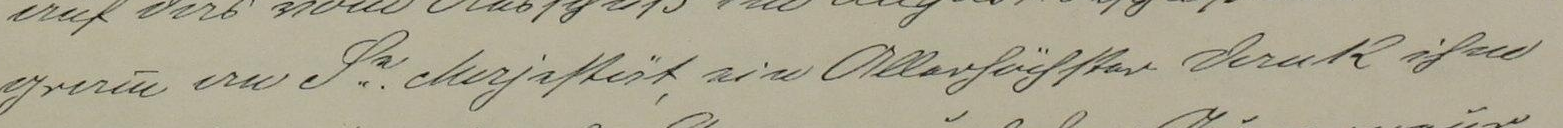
gramm an Se. Majestät ein Allerhöchster Dank ihm
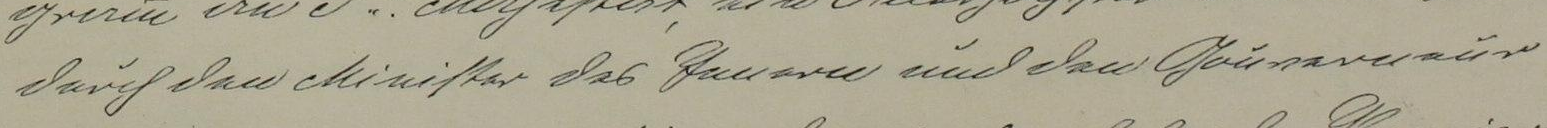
durch den Minister des Innern und den Gouverneur
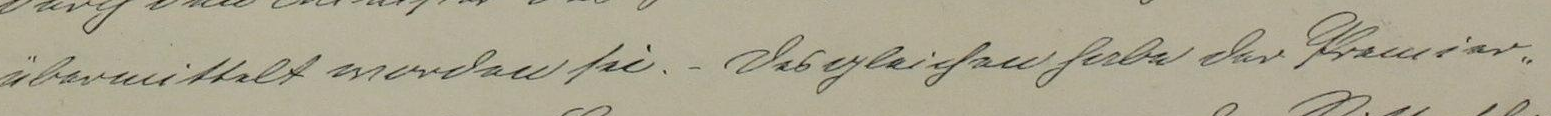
übermittelt worden sei. Desgleichen habe der Premier-
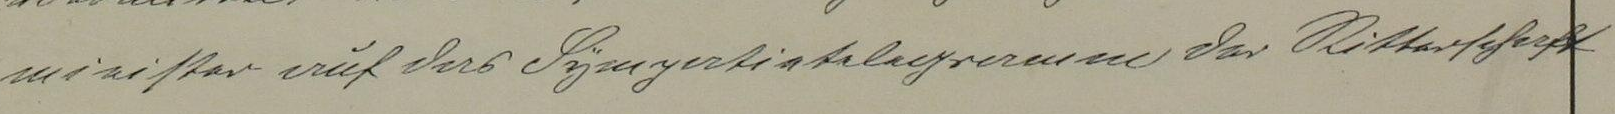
minister auf das Sympatietelegramm der Ritterschaft
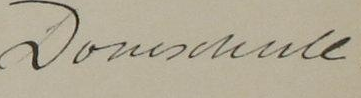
Domschule
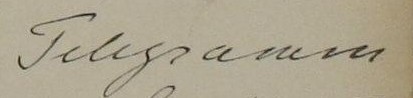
Telegramm
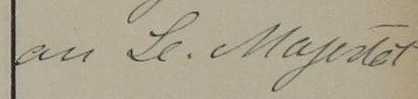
an Se. Majestät
